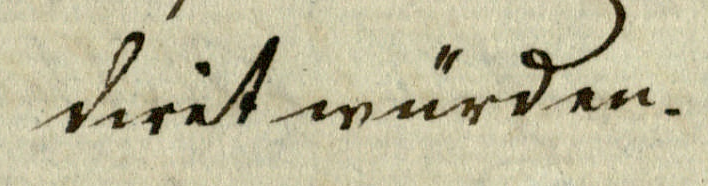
diret würden.
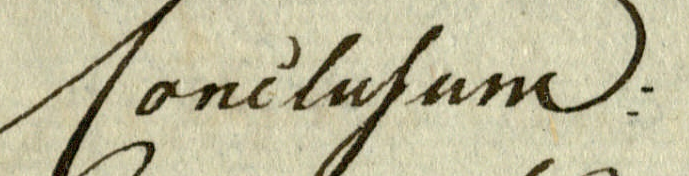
Conclusum:
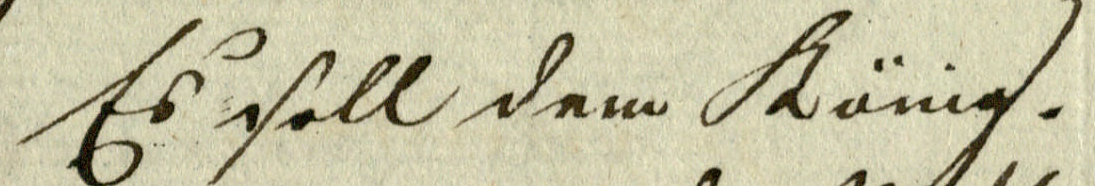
Es soll dem König¬
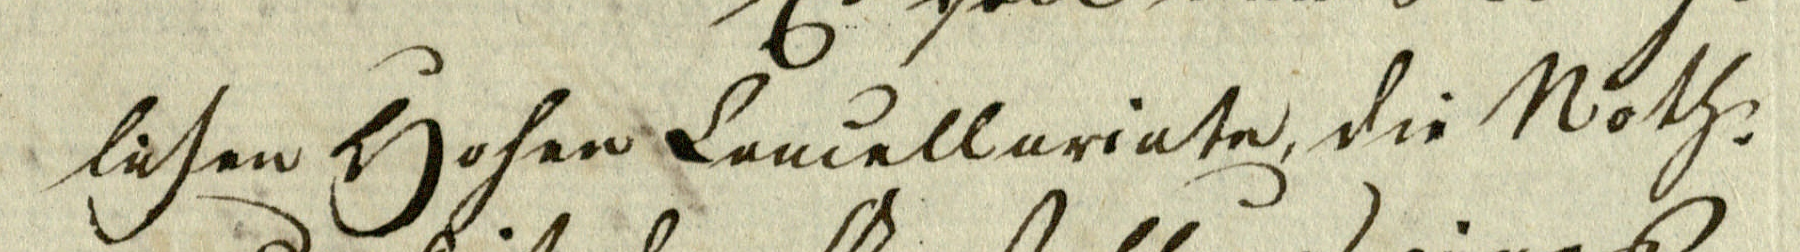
lichen Hohen Cancellariate, die Noth¬
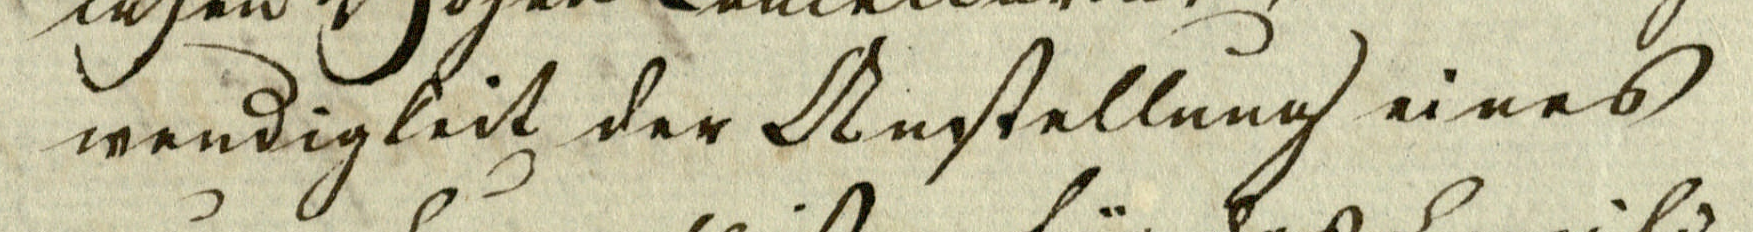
wendigkeit der Anstellung eines
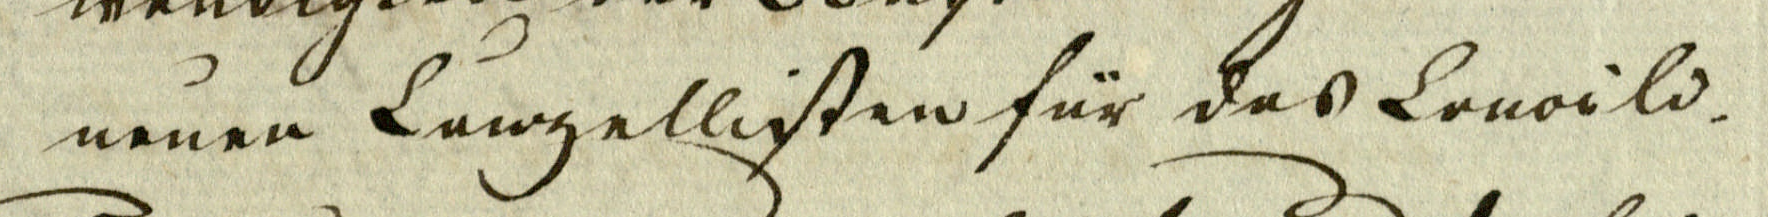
neuen Canzellisten für das Concili¬
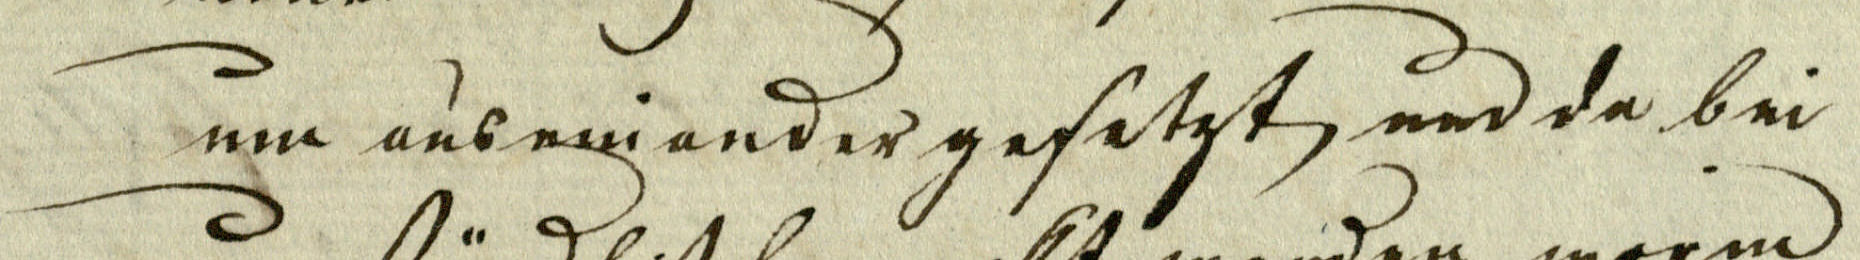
um auseinander gesetzt und dabei
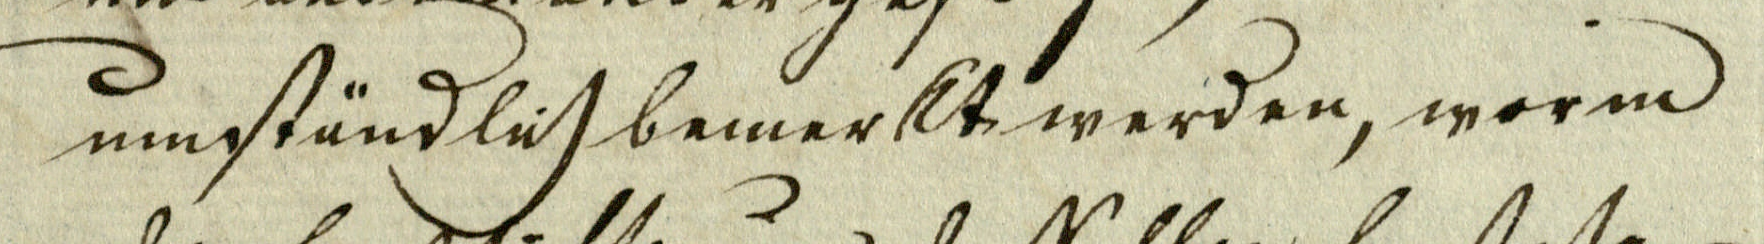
umständlich bemerkt werden, worin
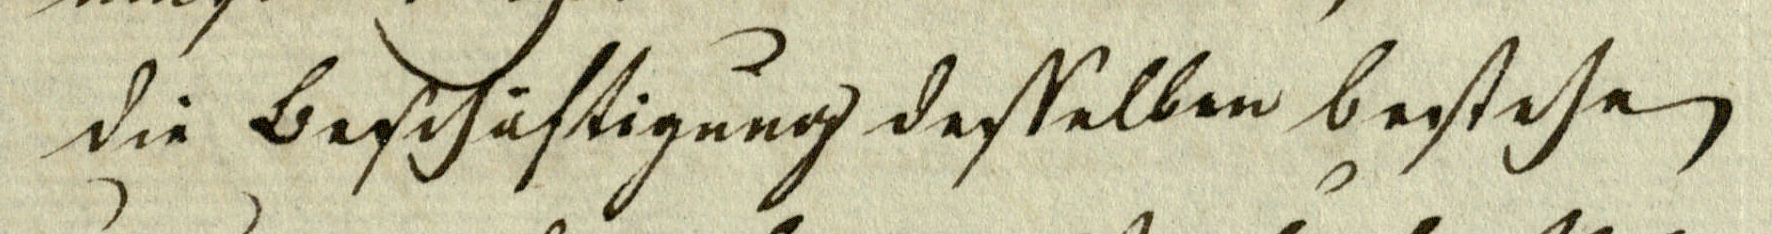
die Beschäftigung desselben bestehe
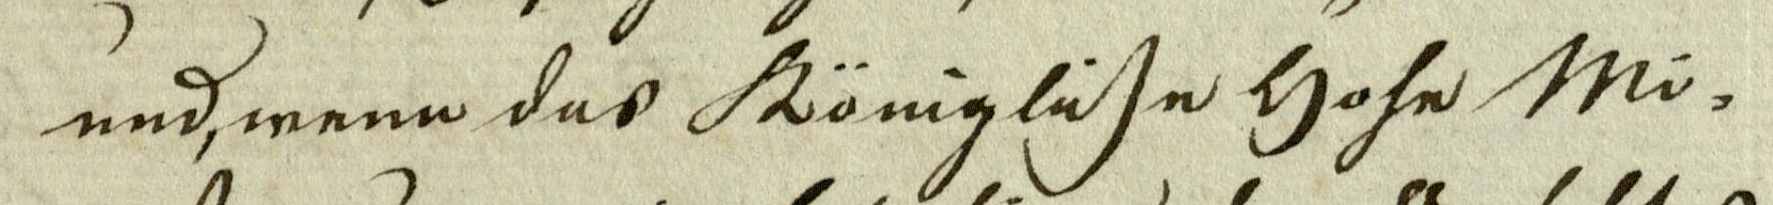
und, wenn das Königliche Hohe Mi¬
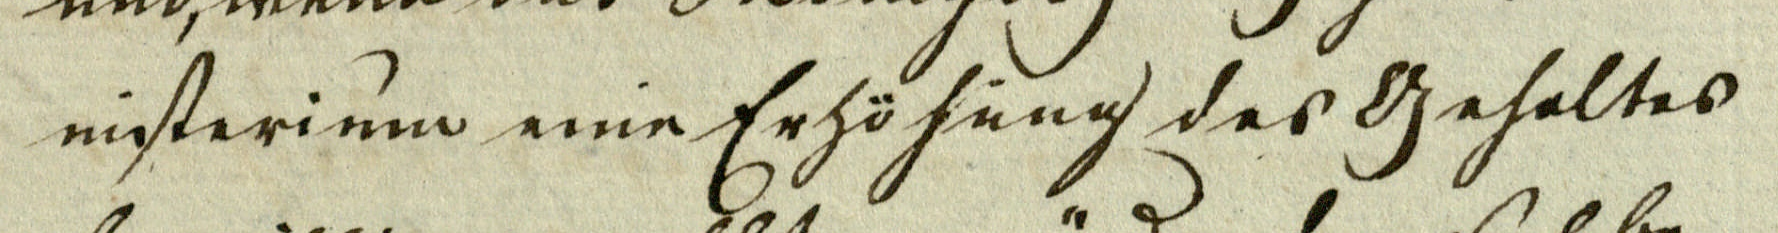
nisterium eine Erhöhung des Gehaltes
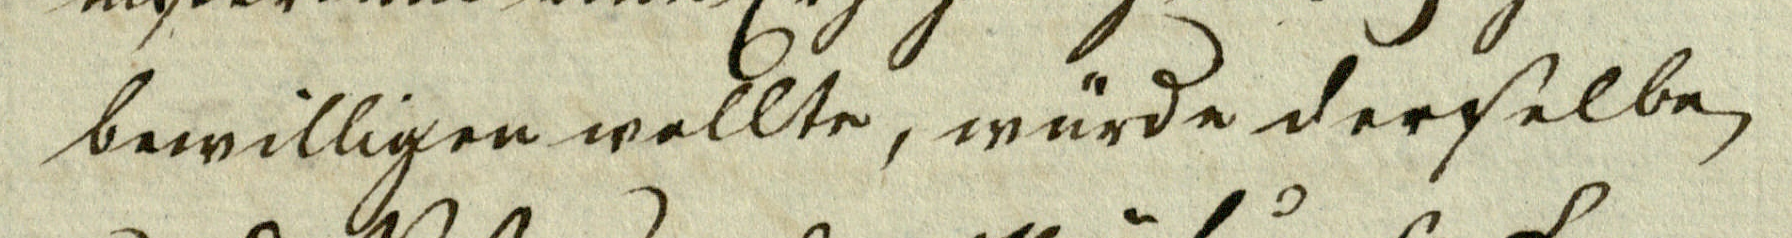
bewilligen wollte, würde derselbe,
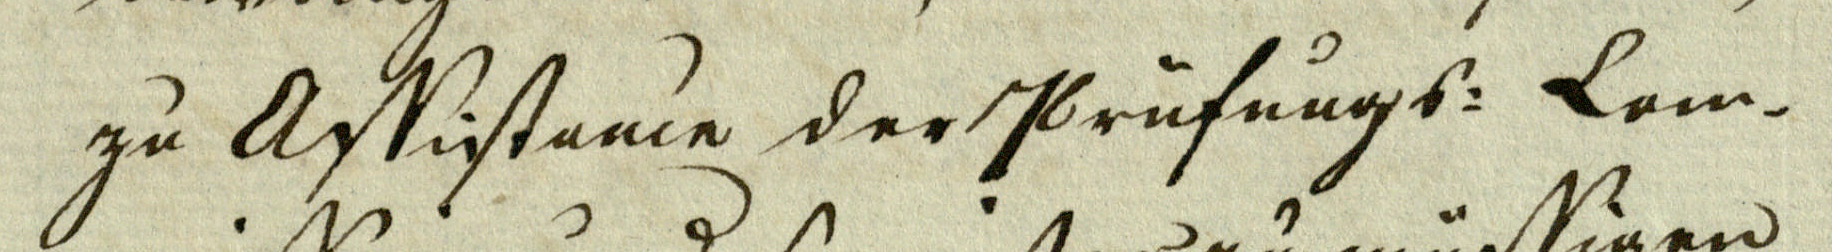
zu Assistence der Prüfungs-Com¬
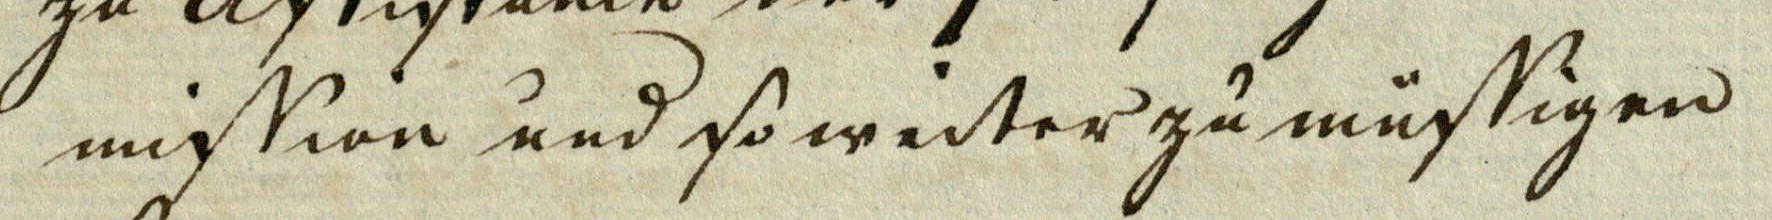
mission und so weiter zu müssigen
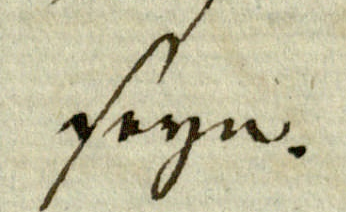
seyn.
